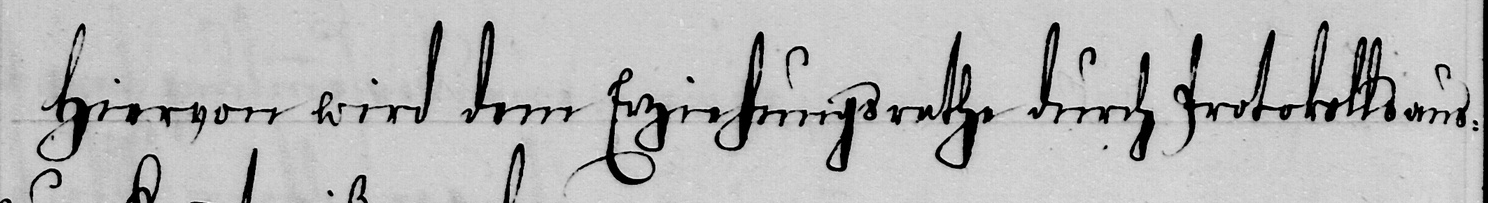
Hiervon wird dem Erziehungsrathe durch Protokollsau¬
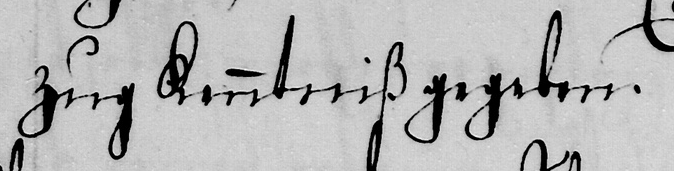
szug Kenntniß gegeben.
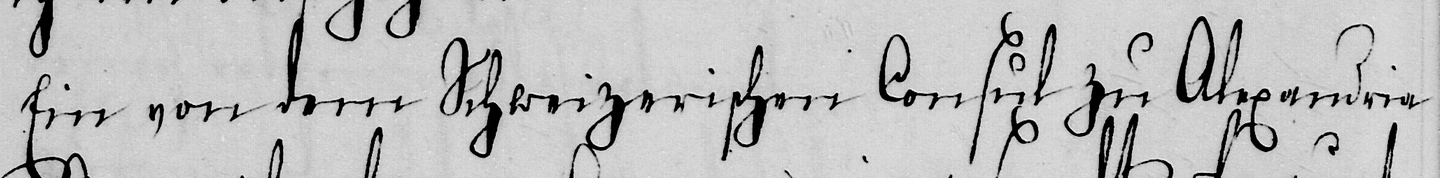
Ein von dem Schweizerischen Consul zu Alexandria
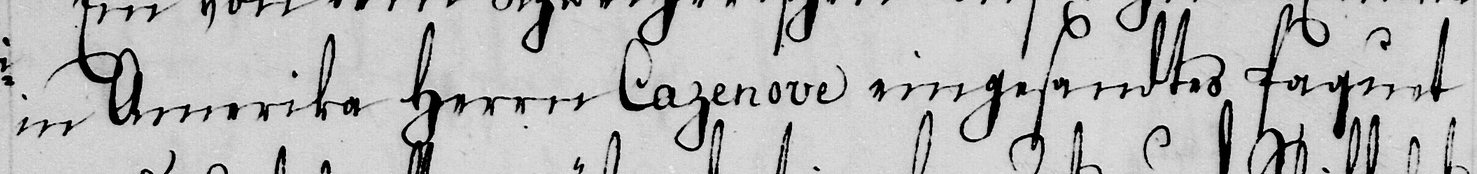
in Amerika Herrn Cazenove eingesandtes Paquet
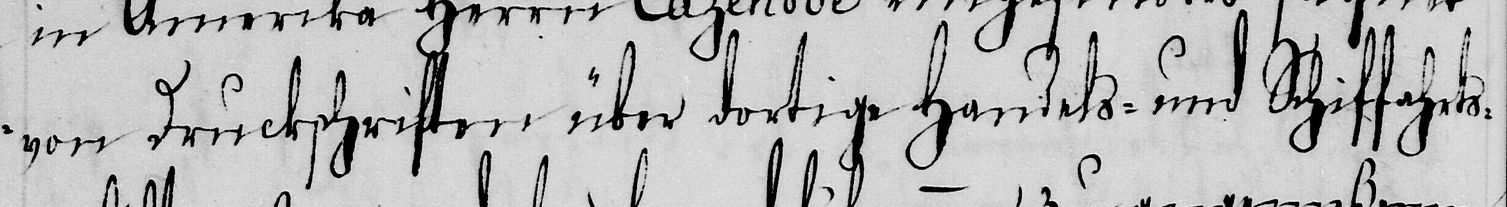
von Druckschriften über dortige Handels- und Schiffahr¬
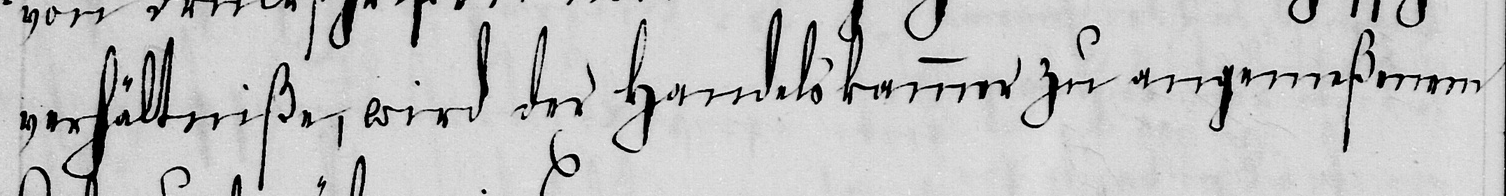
verhältniße, wird der Handelskammer zu angemeßenem
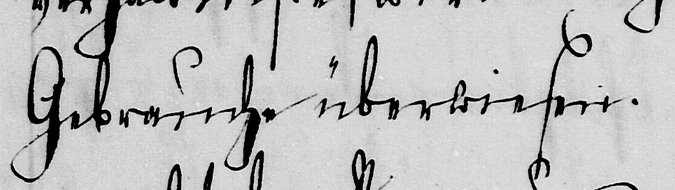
Gebrauche überwiesen.
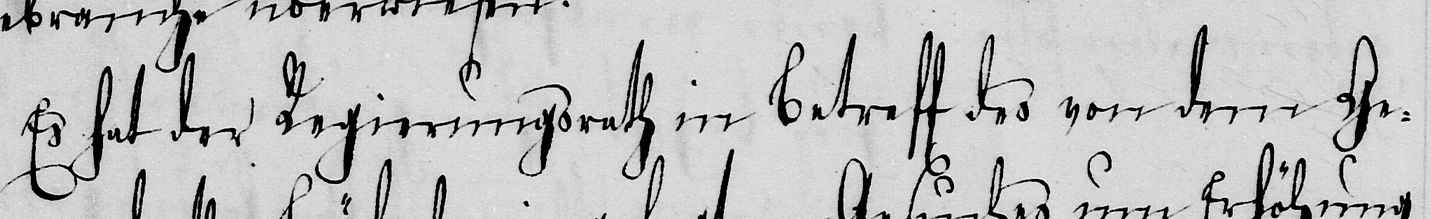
Es hat der Regierungsrath in Betreff des von dem Ge¬
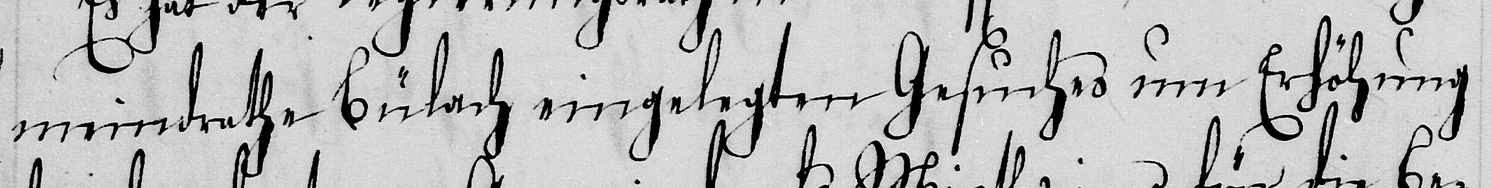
meindrathe Bülach eingelegten Gesuches um Erhöhung
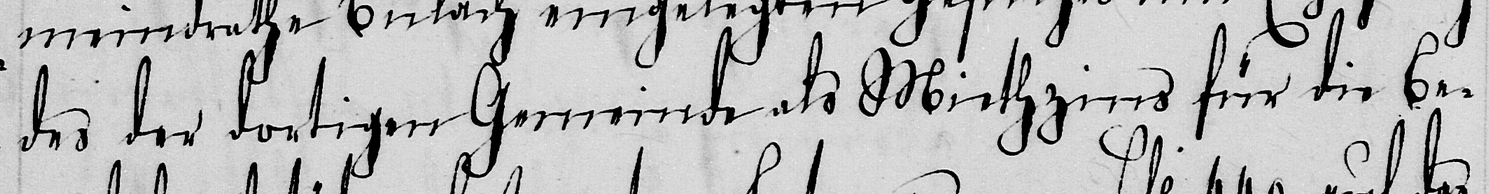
des der dortigen Gemeinde als Miethzins für die Be¬
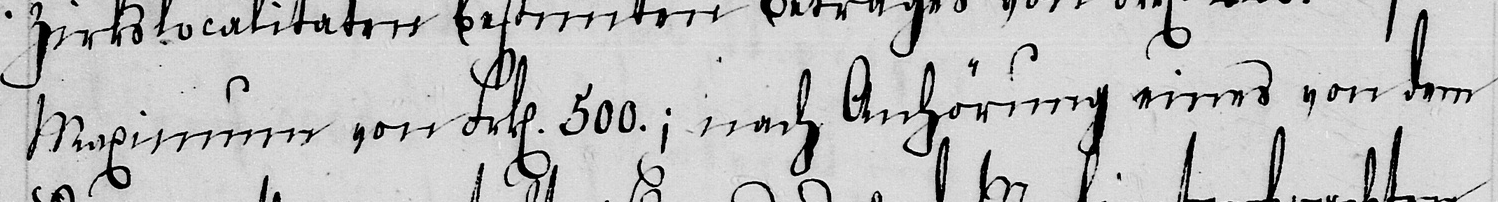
Maximum von Frk[en]. 500.; nach Anhörung eines von dem
